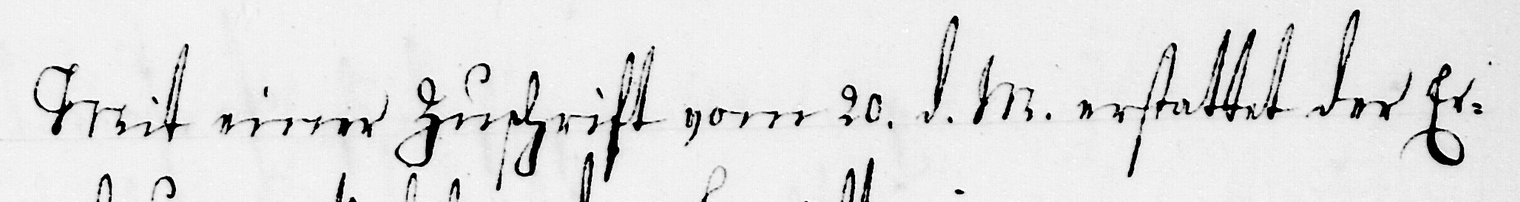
Mit einer Zuschrift vom 20. d. M. erstattet der Er¬
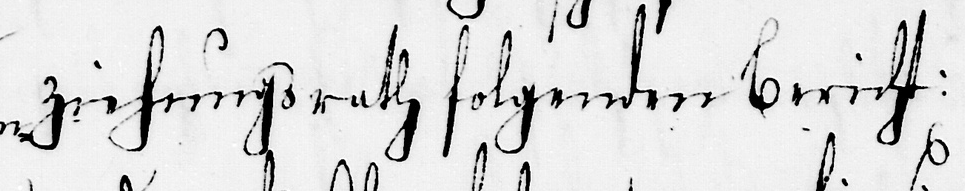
ziehungsrath folgenden Bericht:
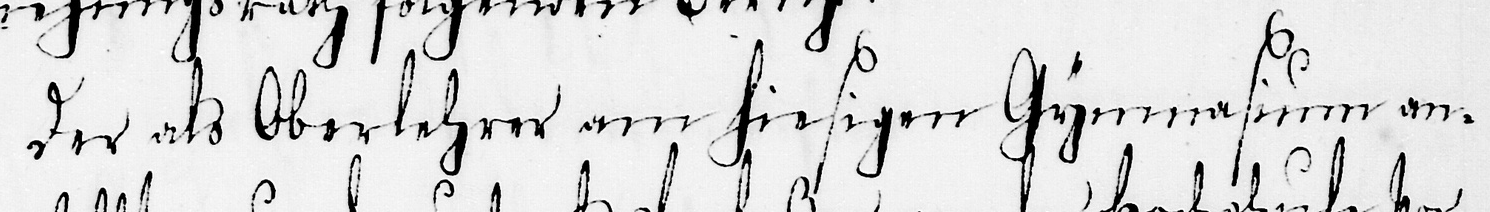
Der als Oberlehrer am hiesigen Gymnasium an¬
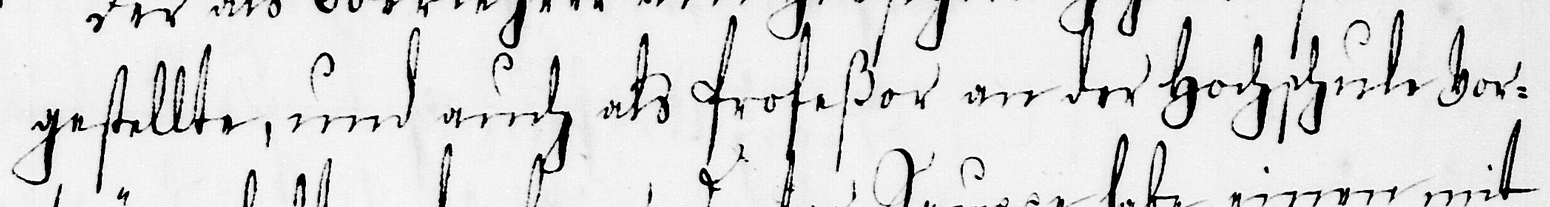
gestellte, und auch als Profeßor an der Hochschule Vor¬
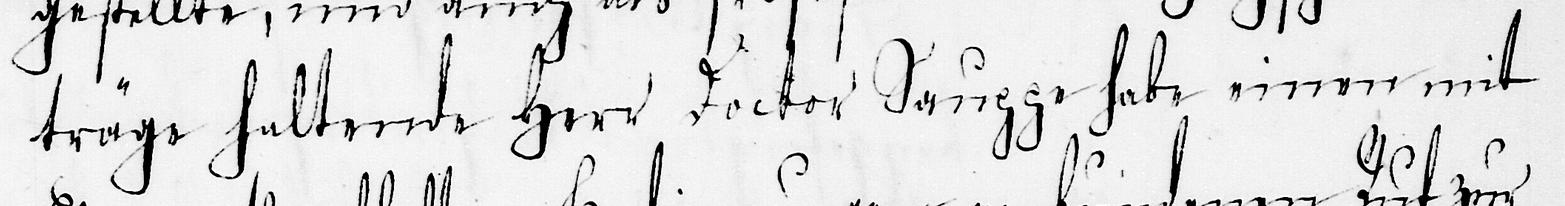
träge haltende Herr Doctor Sauppe habe einen mit
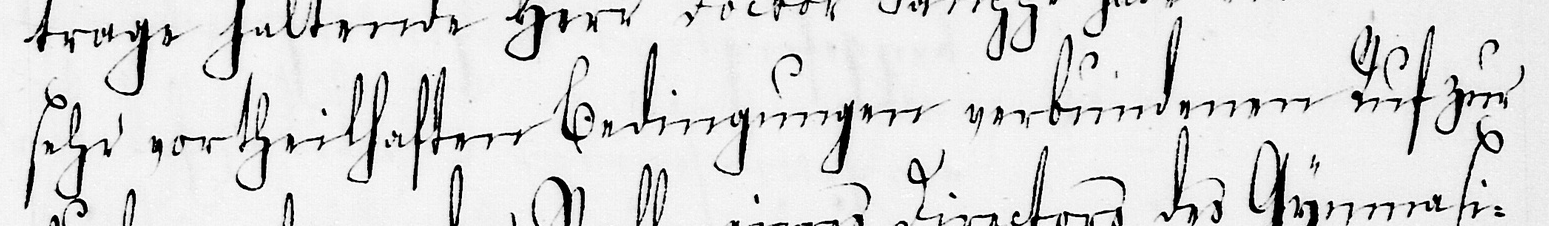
sehr vortheilhaften Bedingungen verbundenen Ruf zur
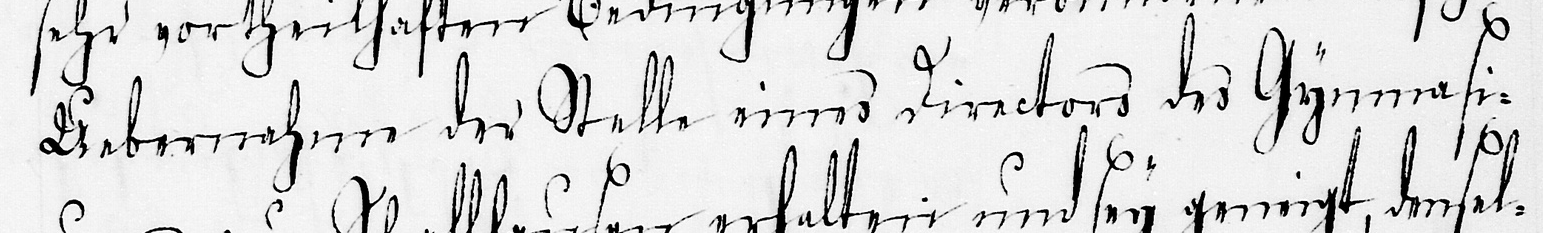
Uebernahme der Stelle eines Directors des Gymnasi¬
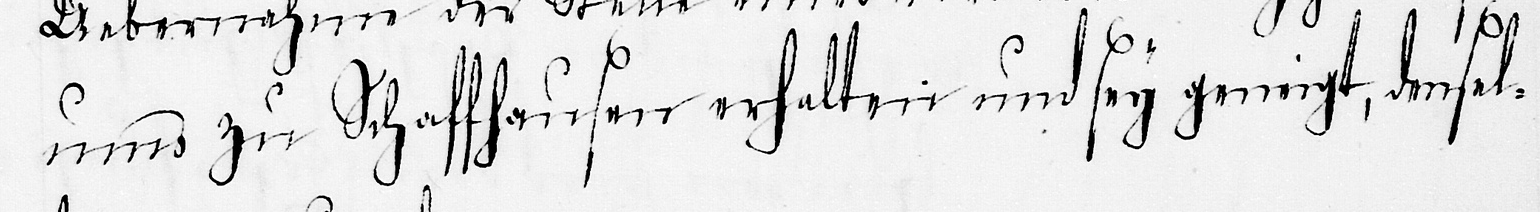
ums zu Schaffhausen erhalten und sey geneigt, densel¬
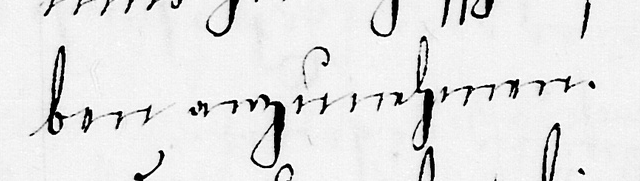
ben anzunehmen.
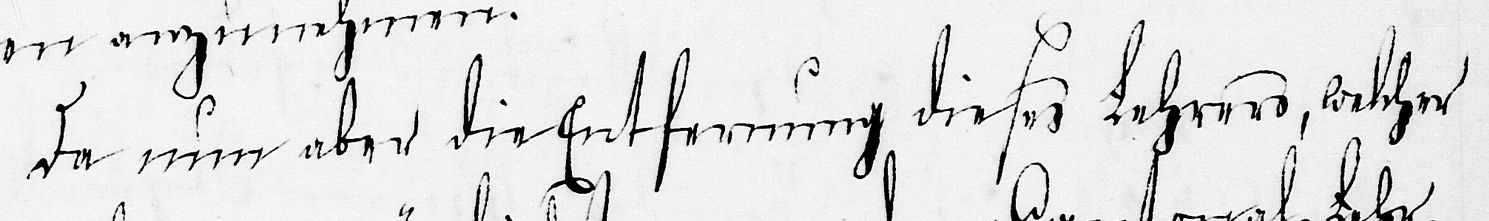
Da nun aber die Entfernung dieses Lehrers, welcher
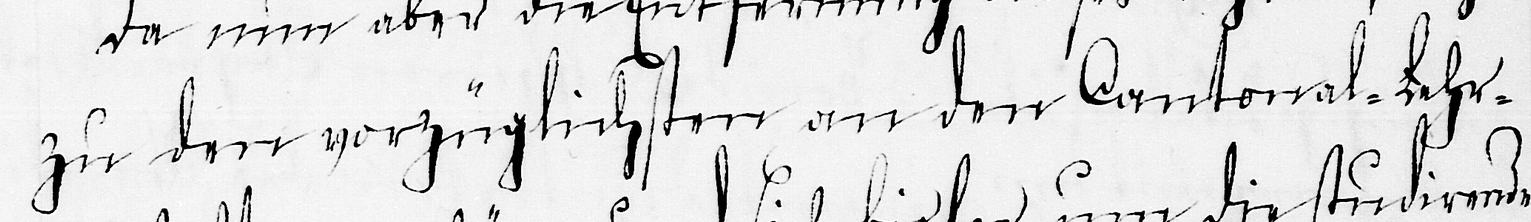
zu den vorzüglichsten an den Cantonal-Lehr¬
